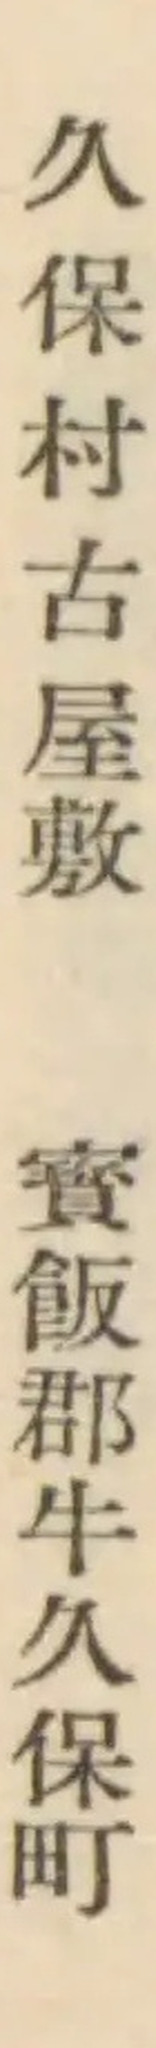久保村古屋敷宝飯郡牛久保町
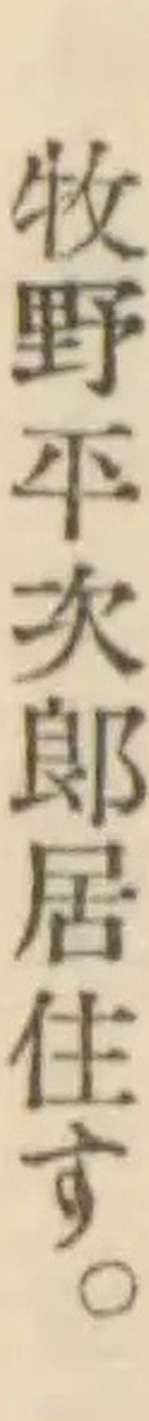牧野平次郎居住す。
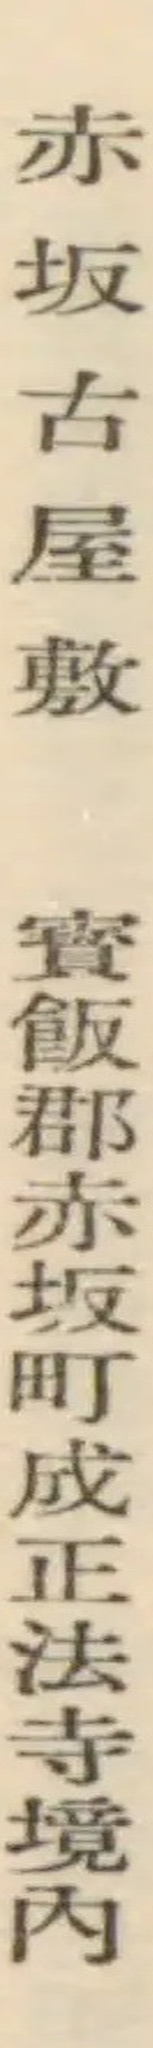赤坂古屋敷宝飯郡赤坂町成正法寺境内
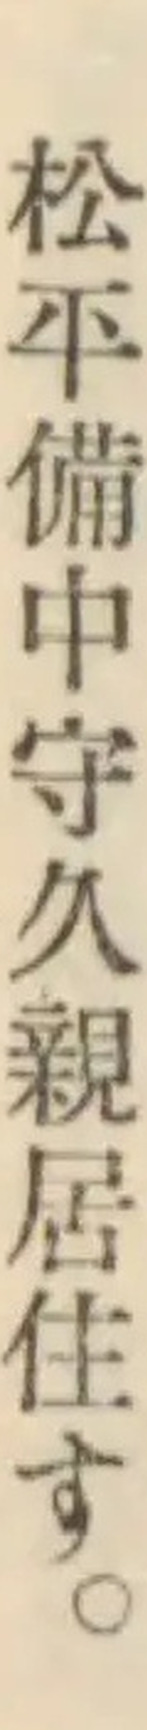松平備中守久親居住す。
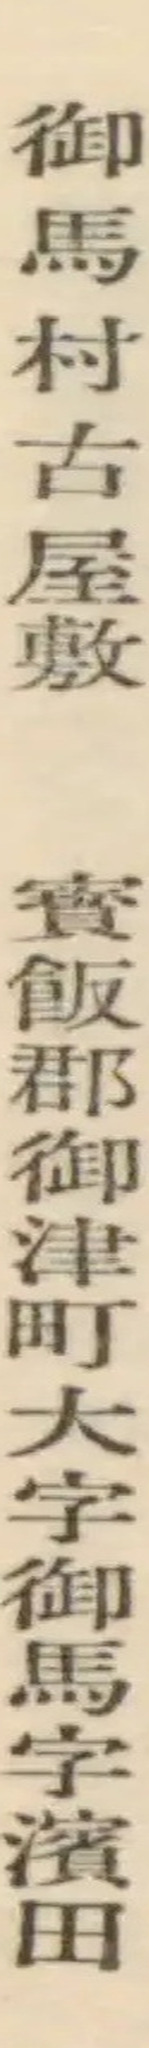御馬村古屋敷宝飯郡御津町大字御馬字浜田
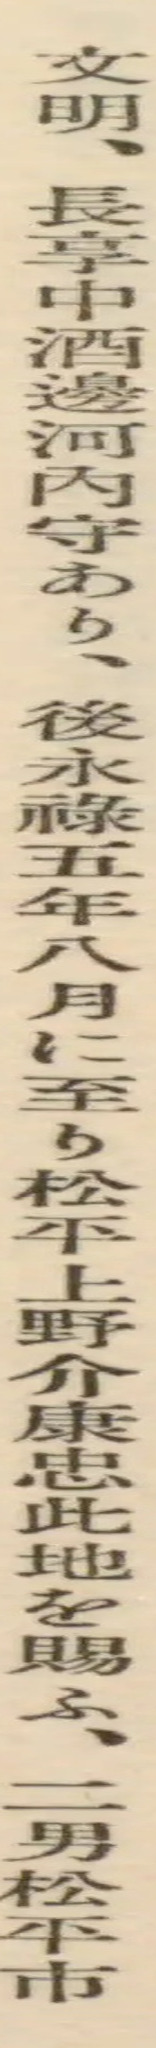文明、長享中酒辺河内守あり、後永禄五年八月に至り松平上野介康忠此地を賜ふ、二男松平市
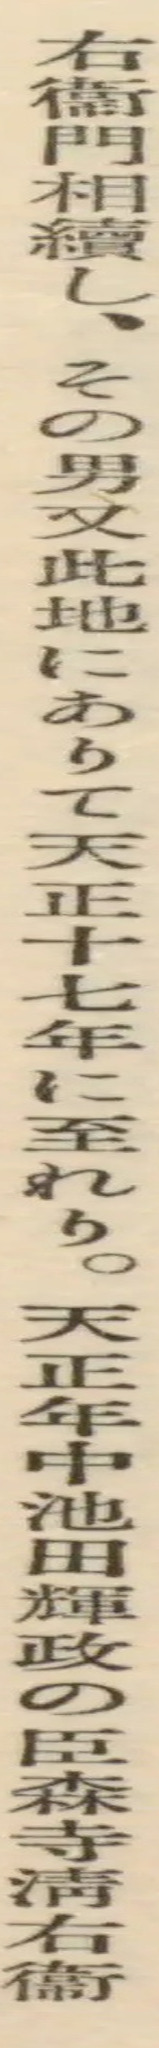右衛門相続し、その男又此地にありて天正十七年に至れり。天正年中池田輝政の臣森寺清右衛
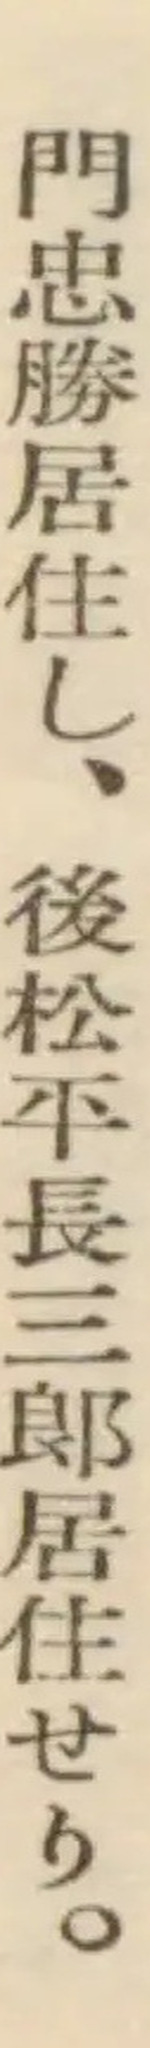門忠勝居住し、後松平長三郎居住せり。
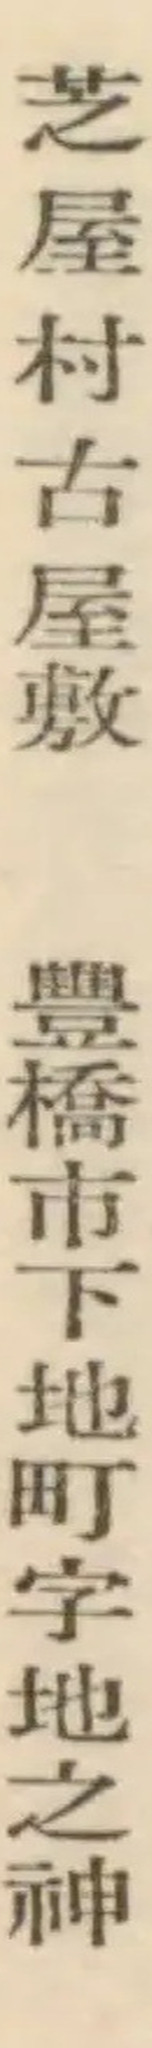芝屋村古屋敷豊橋市下地町字地之神
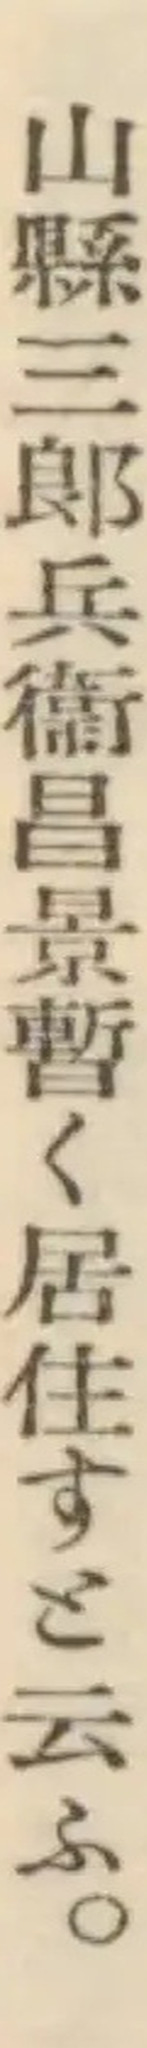山縣三郎兵衛昌景暫く居住すと云ふ。
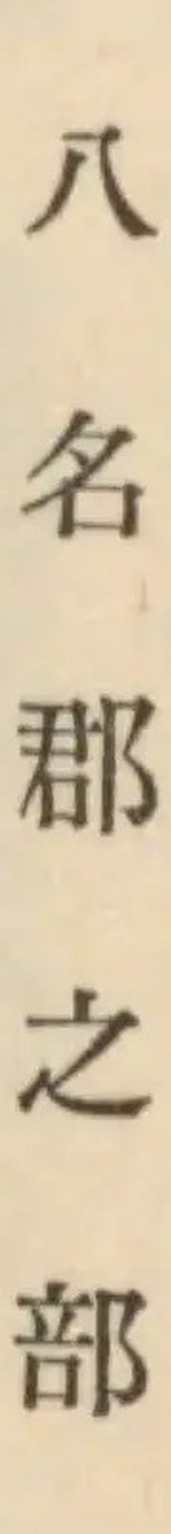八名郡之部
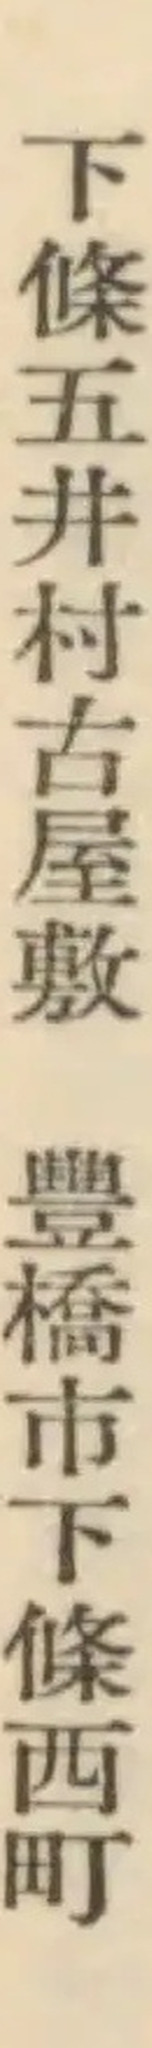下條五井村古屋敷豊橋市下條西町
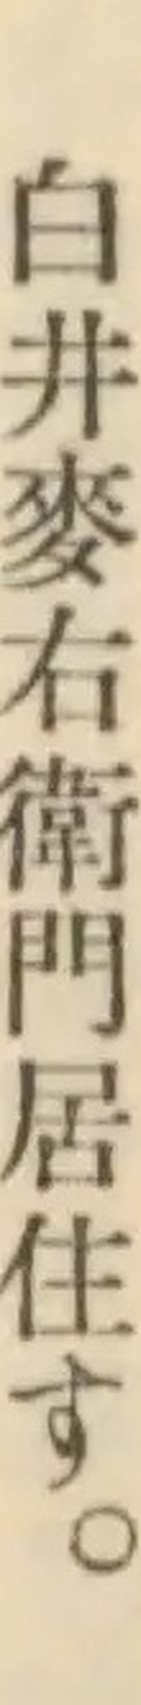白井麦右衛門居住す。
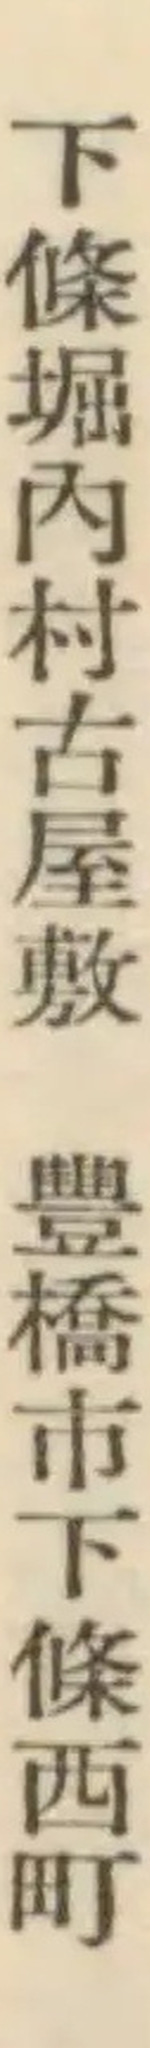下條堀内村古屋敷豊橋市下條西町
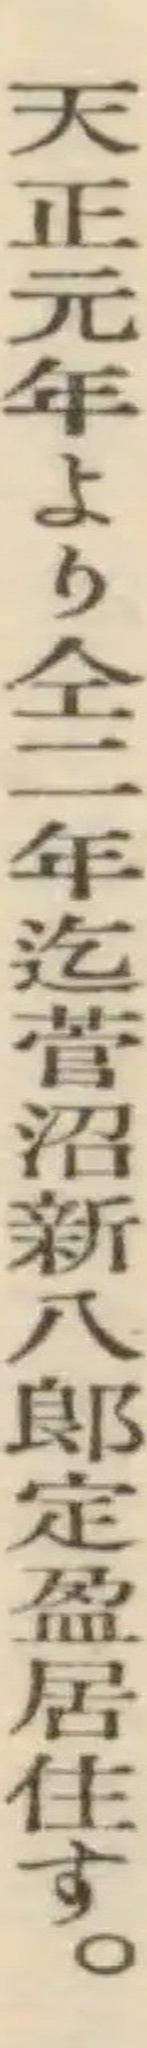天正元年より仝二年迄菅沼新八郎定盈居住す。
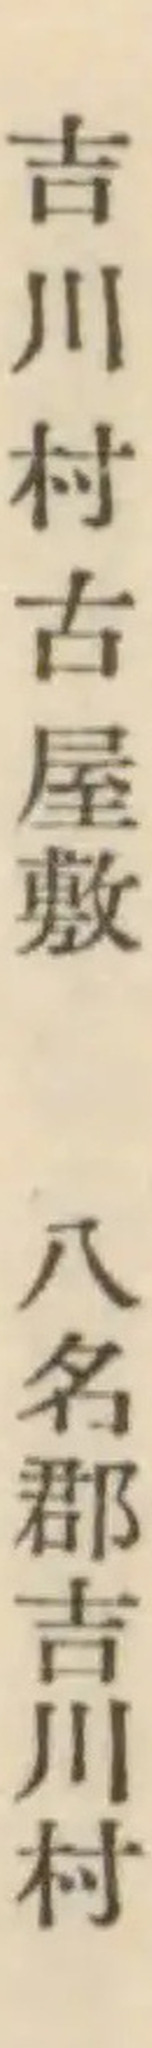吉川村古屋敷八名郡吉川村
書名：東三河之古城
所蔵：国立国会図書館 National Diet Library, JAPAN
